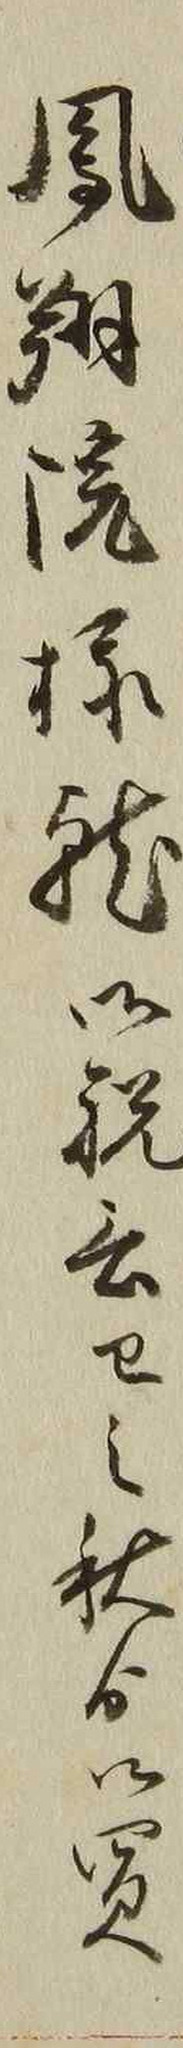鳳翔院様就御祝言巳之秋ゟ御買
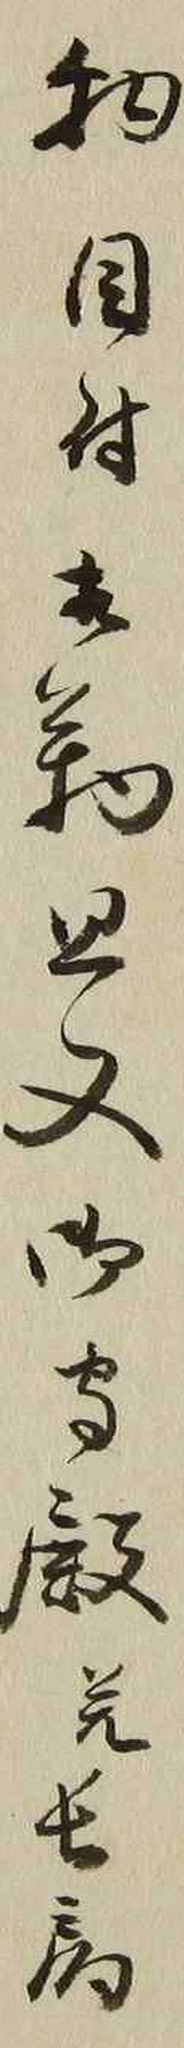物目付相勤且又御守殿并長局
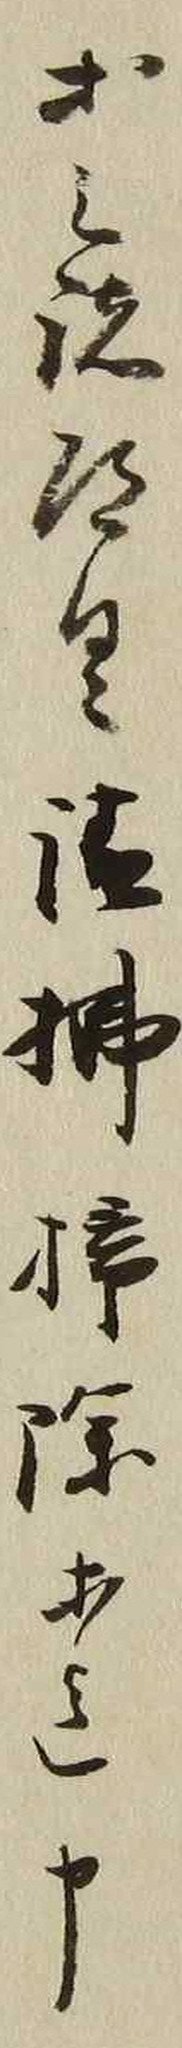等之諸道具請払掃除等迄申
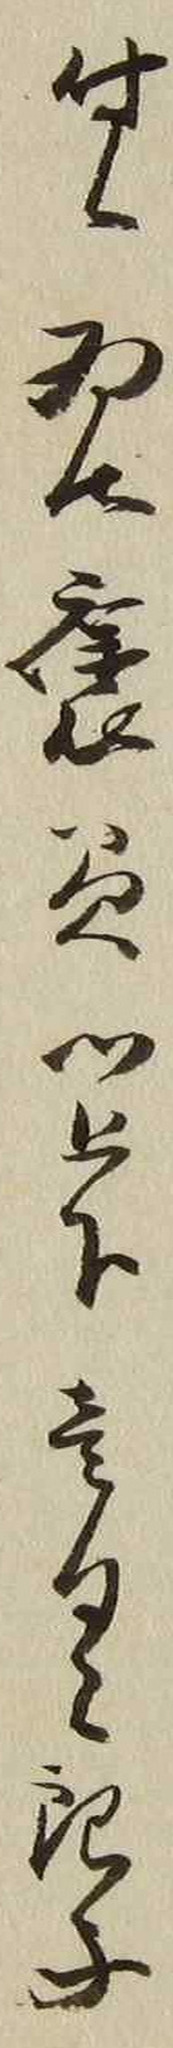付候為御褒美御上下壱具銀子
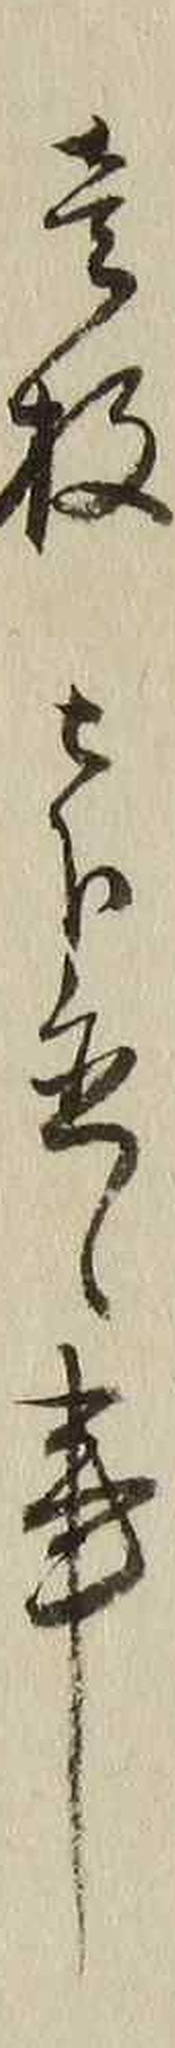壱枚被下置候事
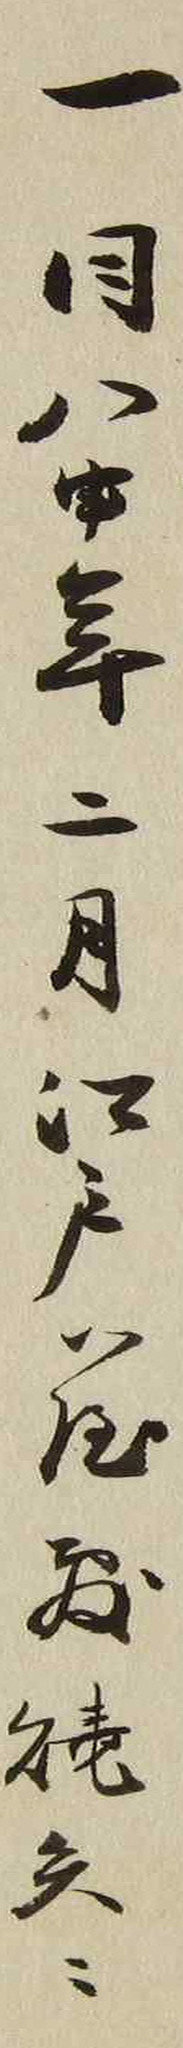一同八申年二月江戸御屋敷焼失ニ
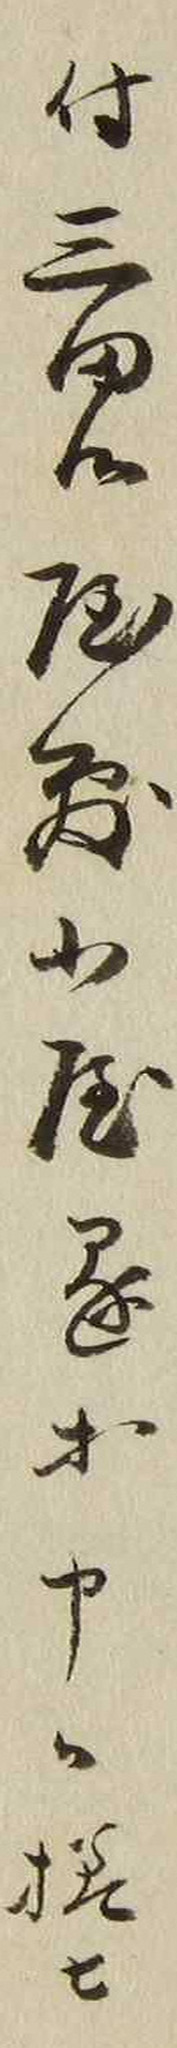付三田御屋敷小屋懸等申候様被
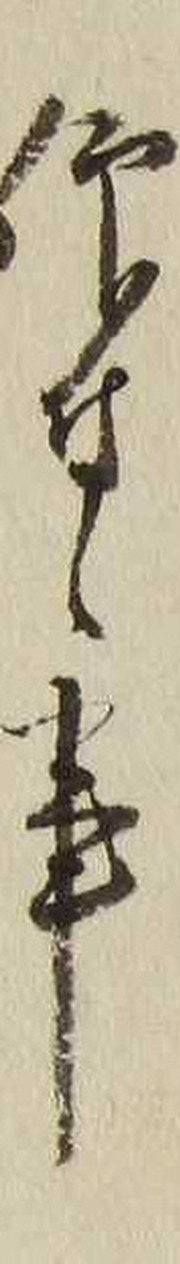仰付候事
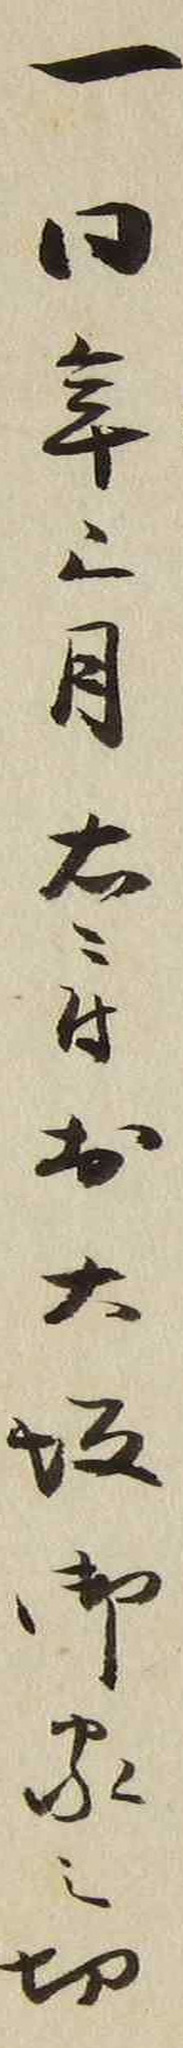一同年三月右ニ付於大坂御家之切
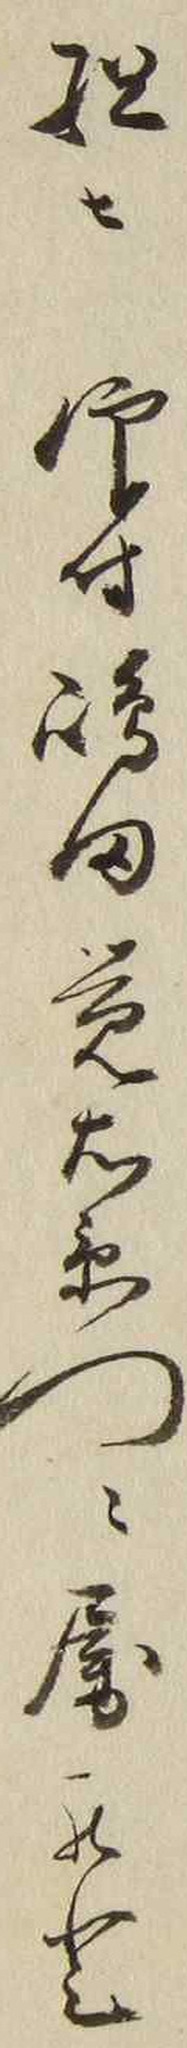組被仰付島田覚右衛門ニ属罷登
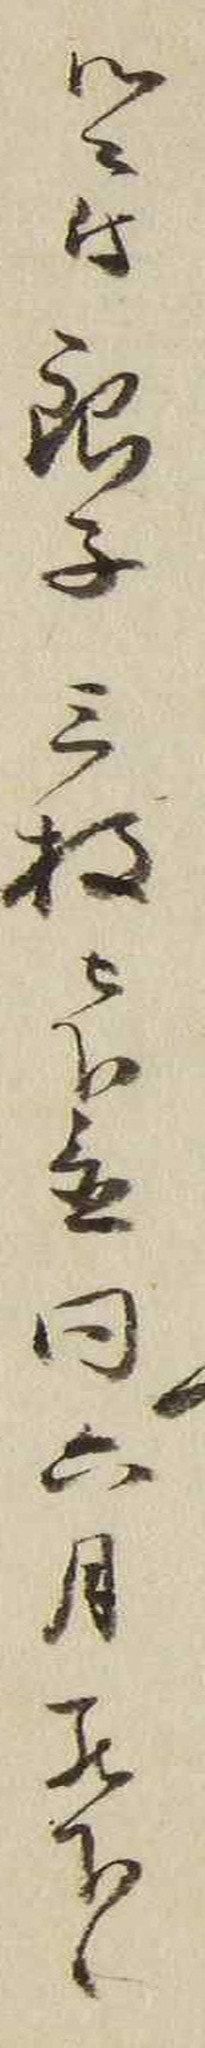候ニ付銀子三枚被下置同六月罷下候

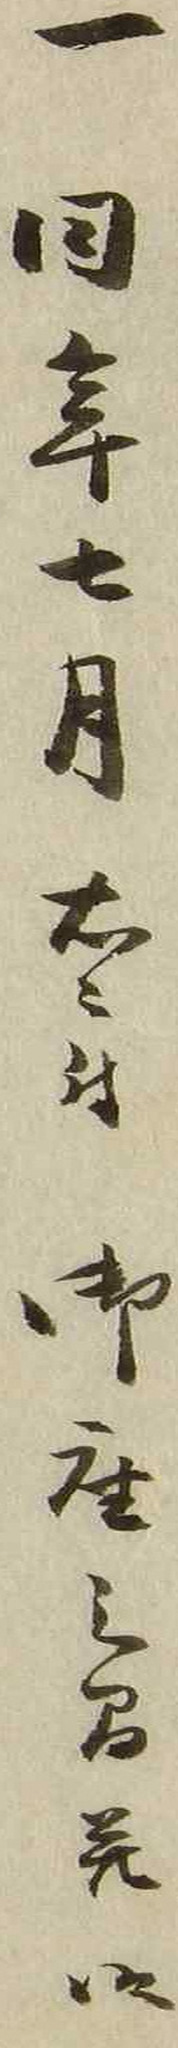一同年七月右ニ付御座之間并御
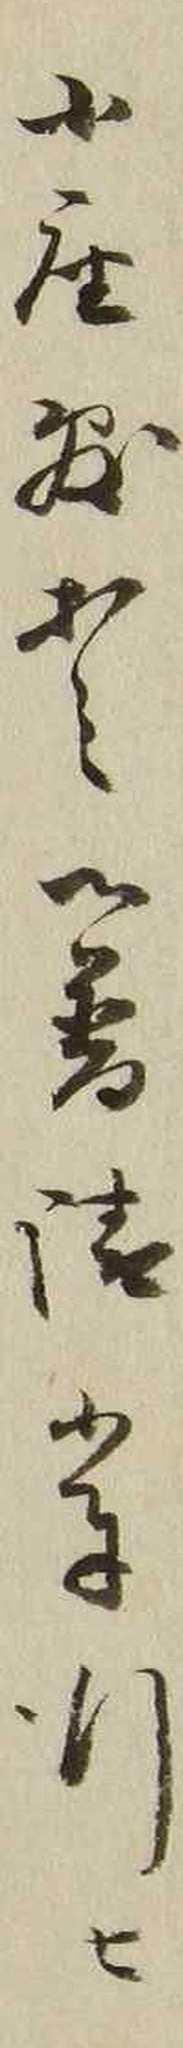小座敷等之御普請小奉行被
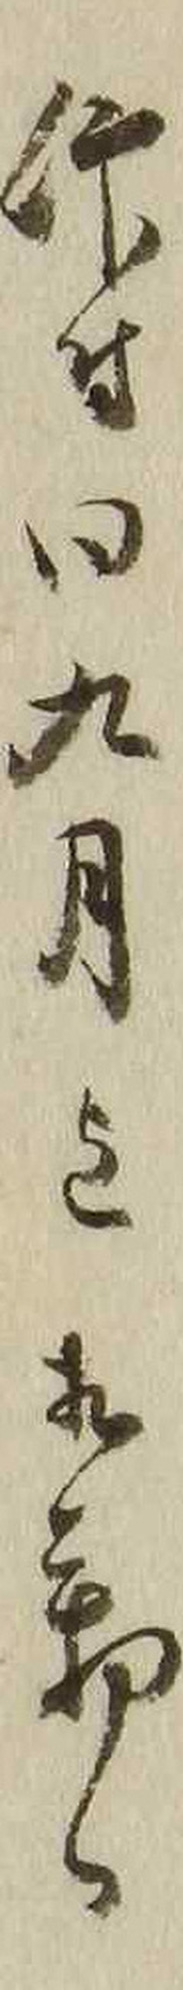仰付同九月迄相勤候
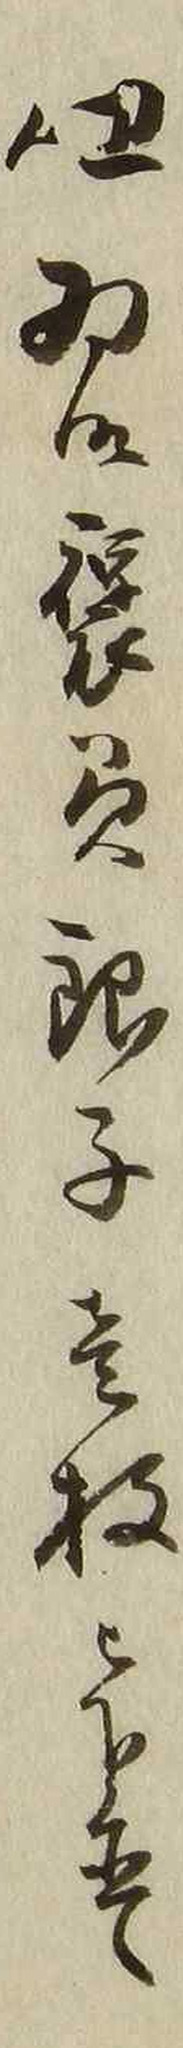但為御褒美銀子壱枚被下置候
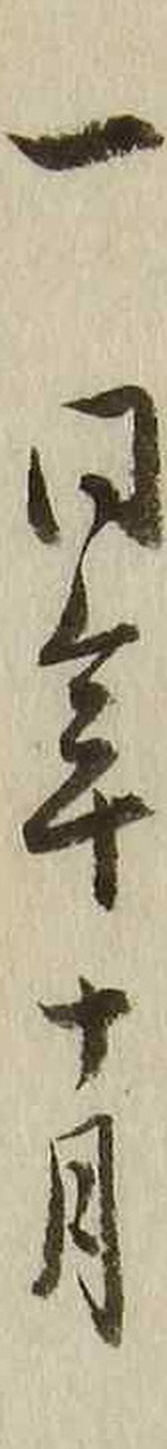一同年十月
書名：諸士系譜　巻之288　さ之部20
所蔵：会津若松市立会津図書館
